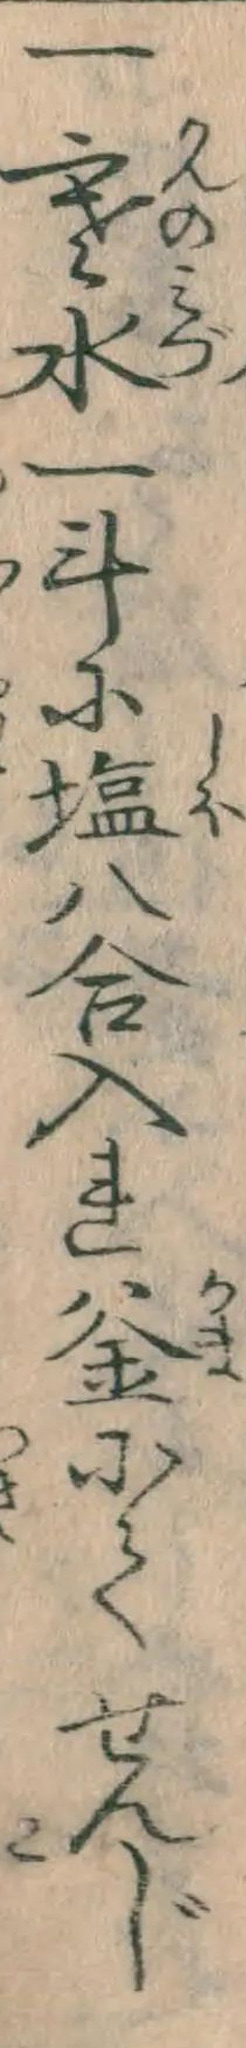一寒水一斗に塩八合入れ釜にてせんじ
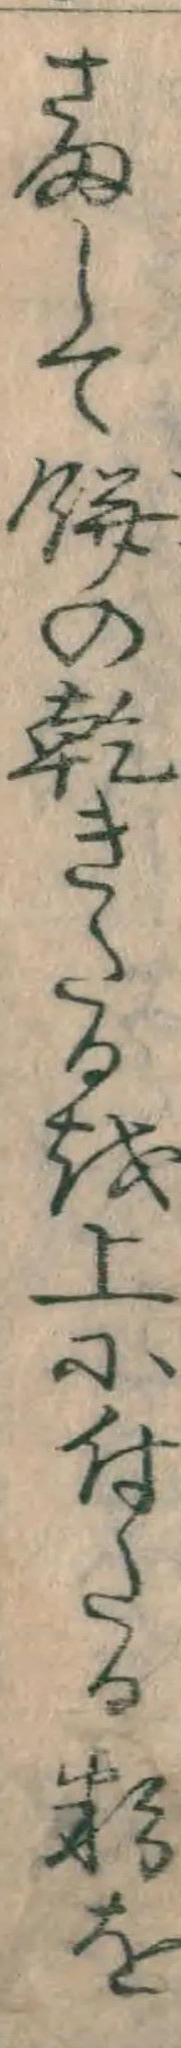さまして餅の乾きたるを上に付たる粉を

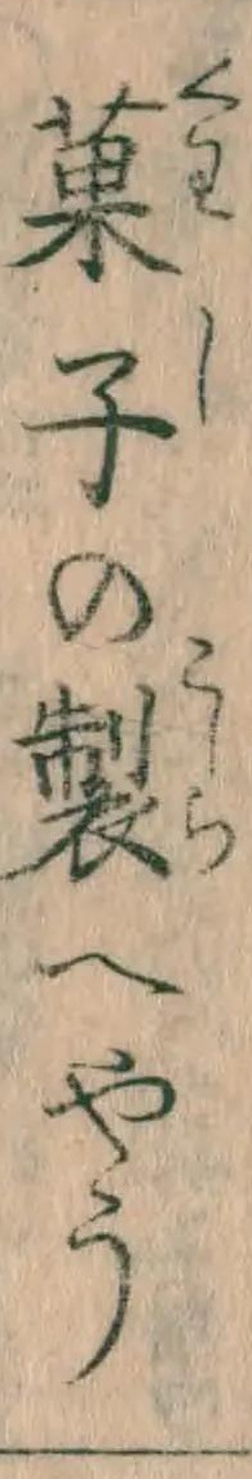菓子の製へやう
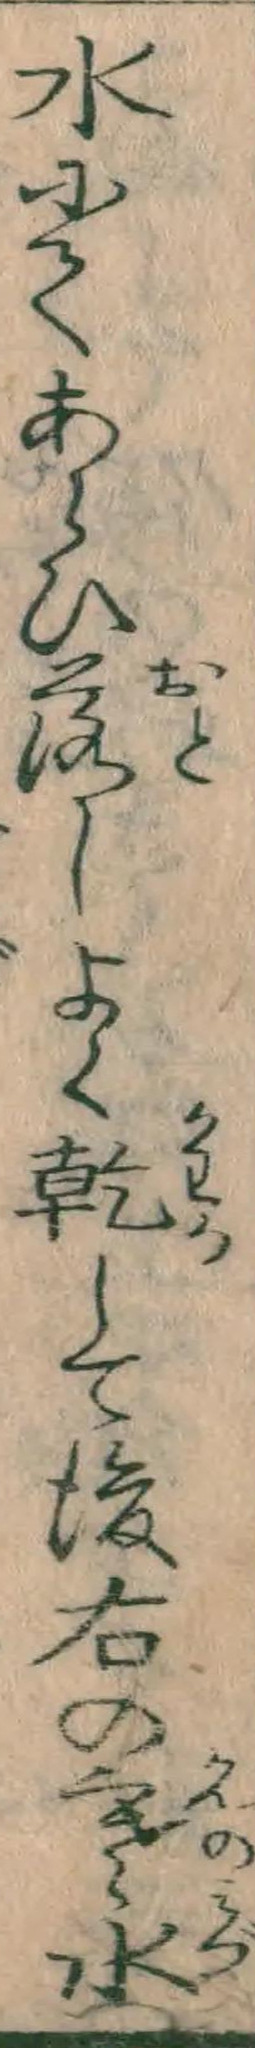水にてあらひ落しよく乾して後右の寒水
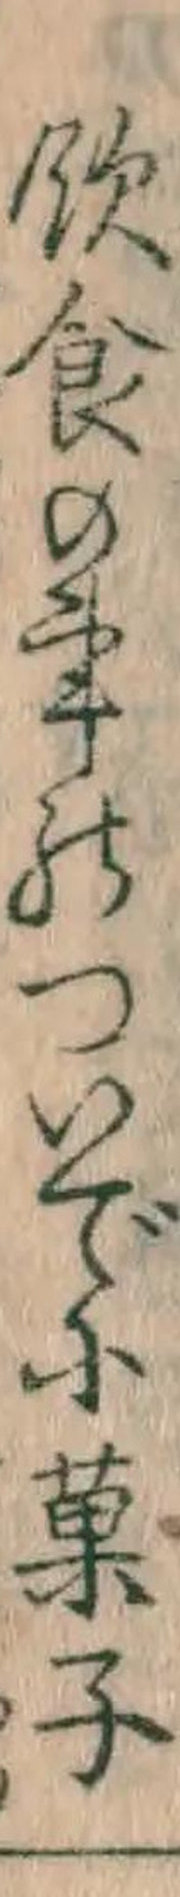飲食の事のついでに菓子
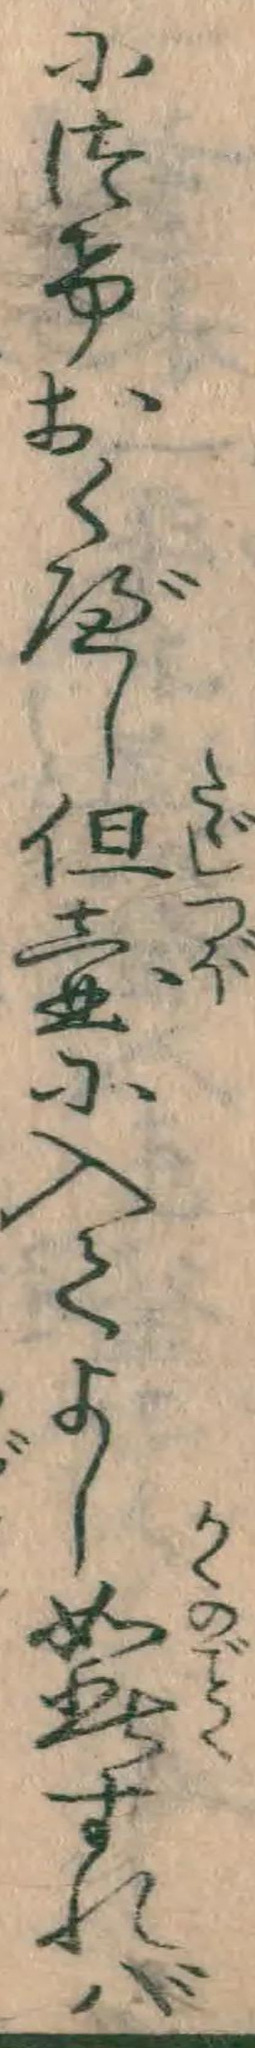につけおくべし但壺に入てよし如此すれば
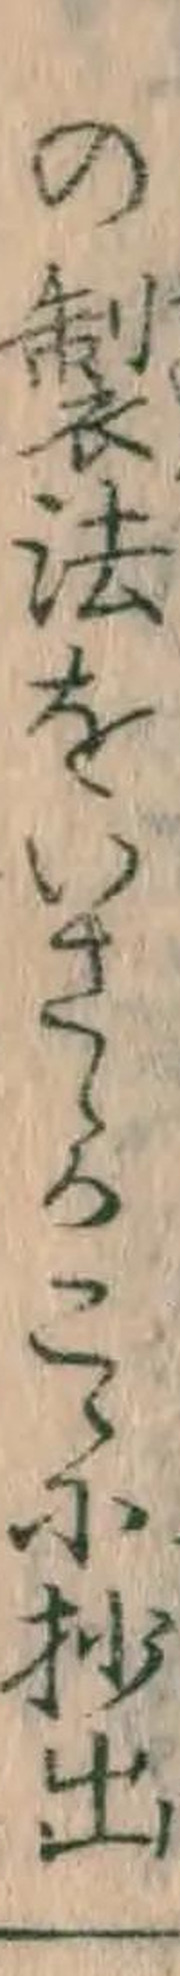の製法をいさゝかこゝに抄出
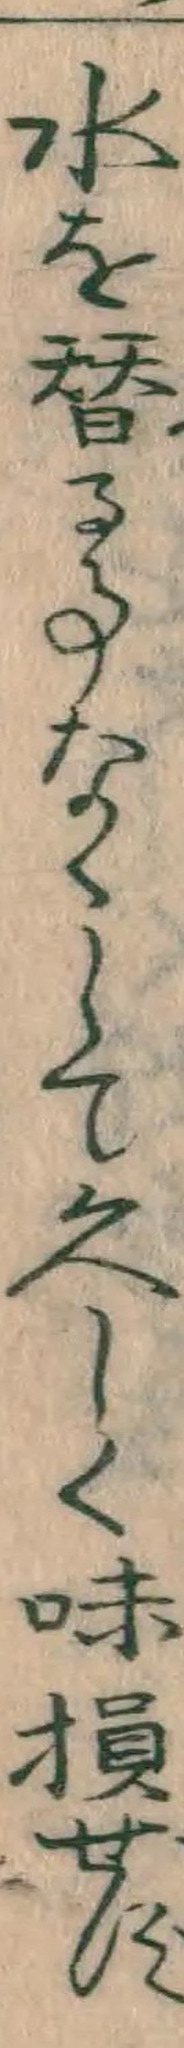水を替る事なくして久しく味損ぜず
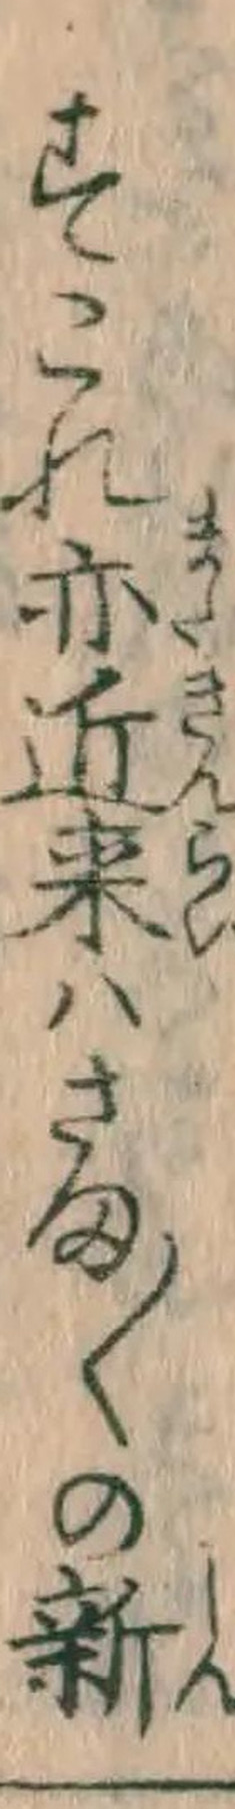すこれ亦近来はさま〳〵の新
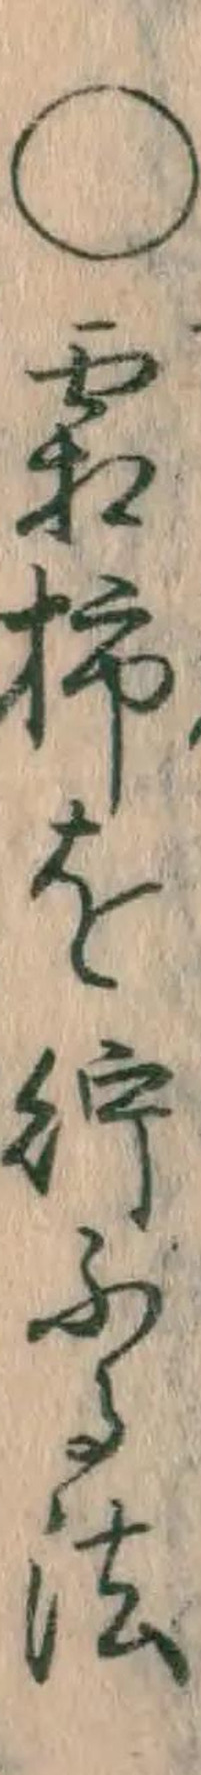○霜柿を貯ふる法
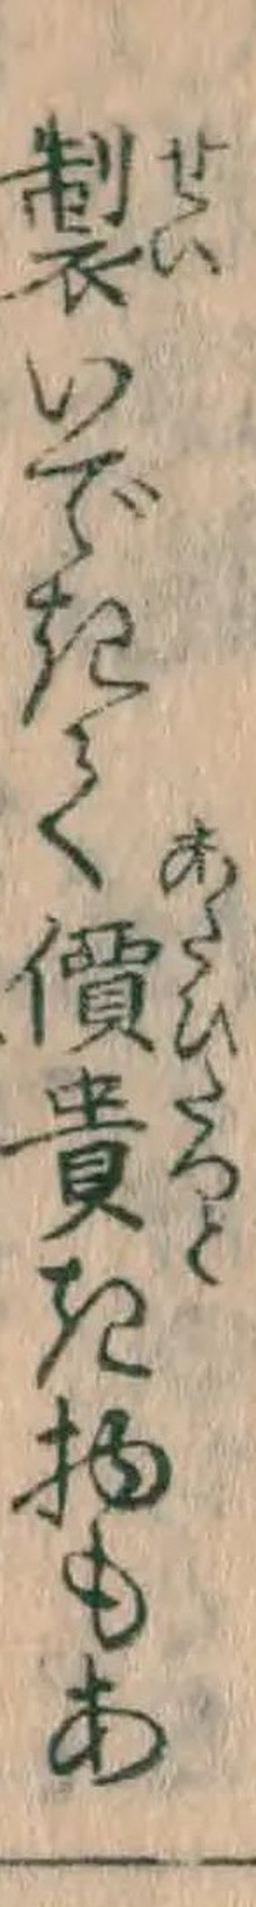製いできて価貴き物もあ
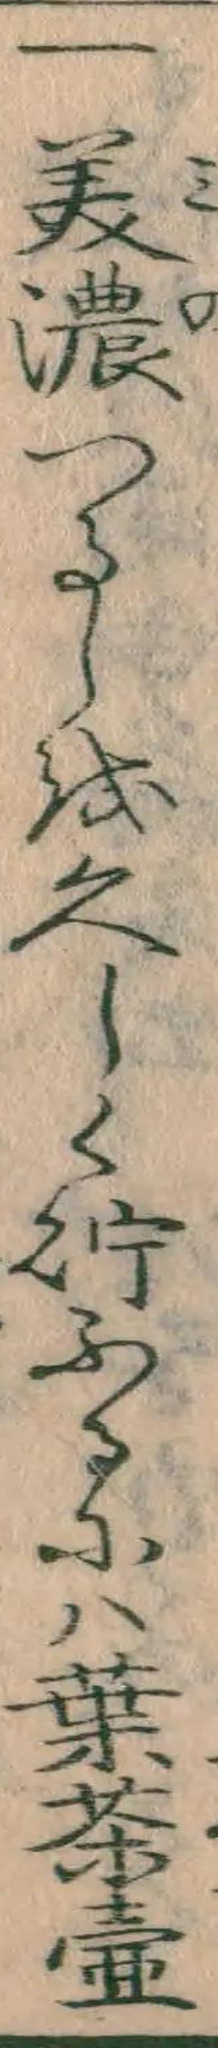一美濃つるしを久しく貯ふるには葉茶壺
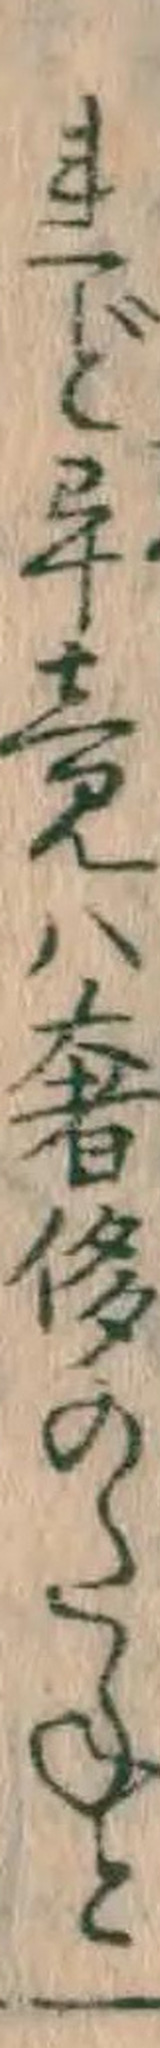れど畢竟は奢侈のたねと
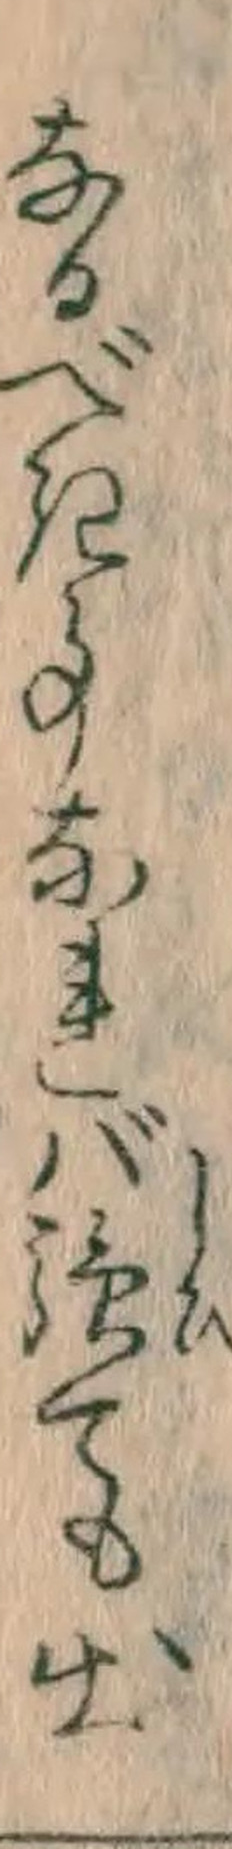なるべき事なれば強ても出
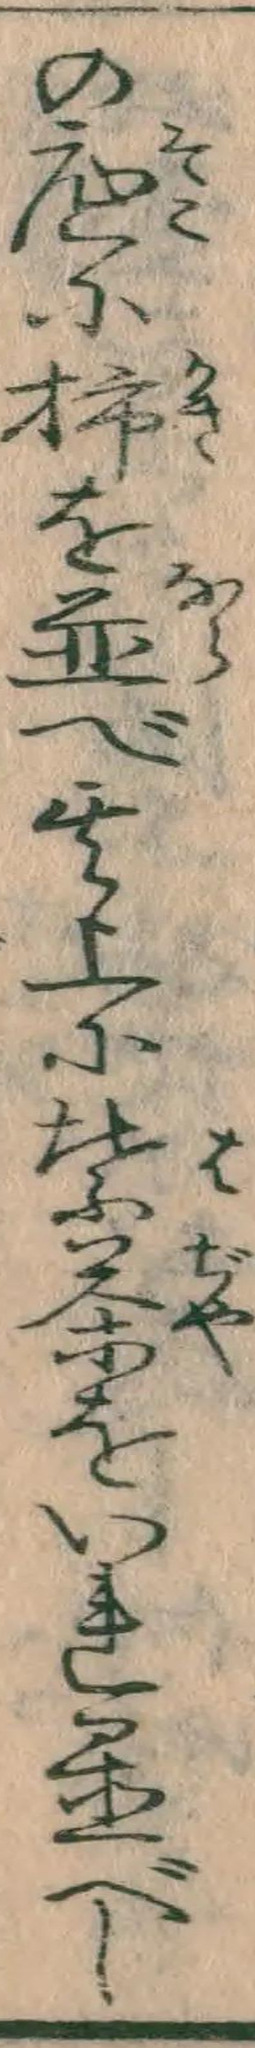の底に柿を並べ其上に葉茶をいれ置べし
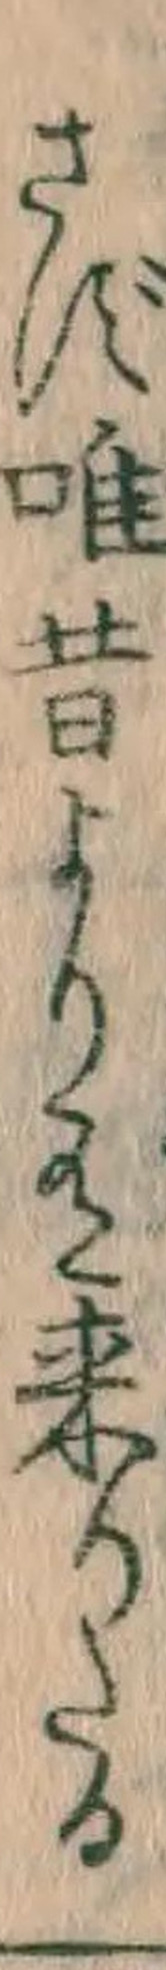さず唯昔より有来りたる
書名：広益秘事大全 3巻. [5]
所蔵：国立国会図書館 National Diet Library, JAPAN
